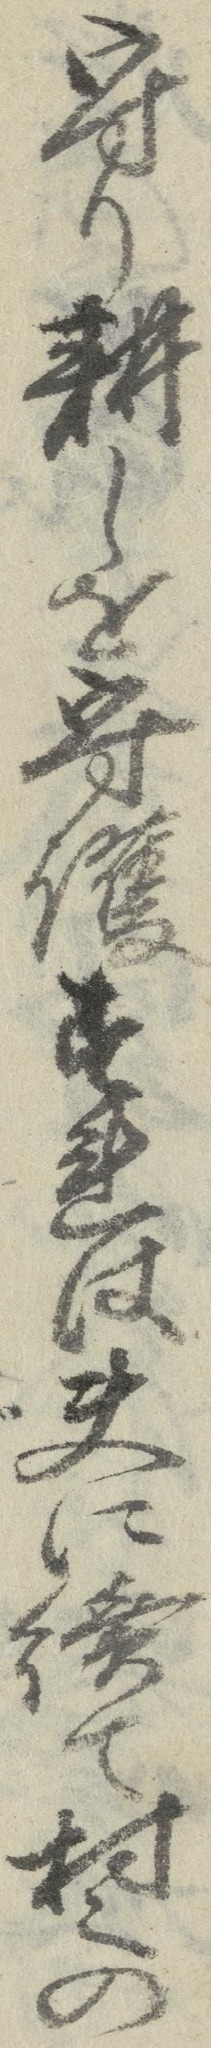守り耕しを守護すれは夫に続て村々の
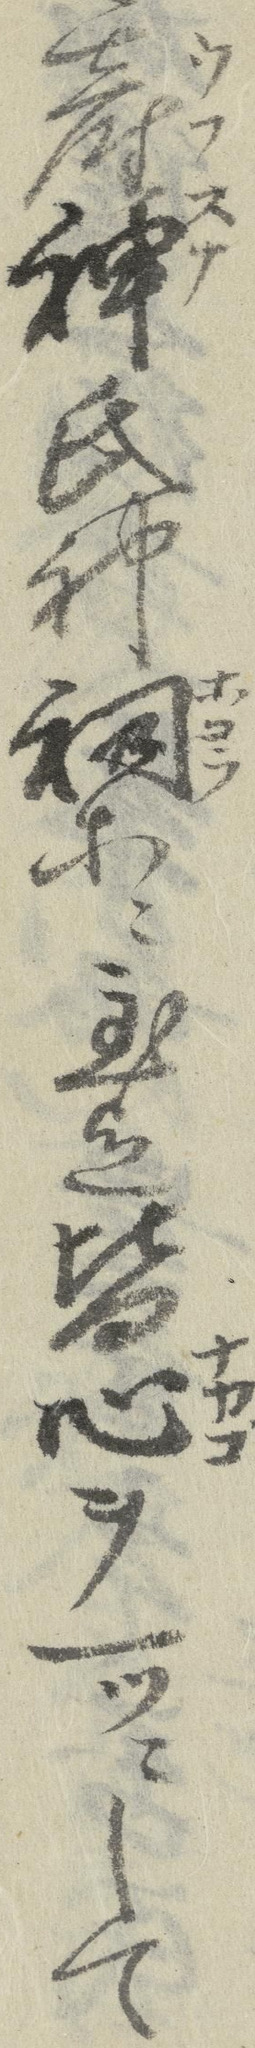産神氏神祠等に至迄皆心ヲ一ツにして

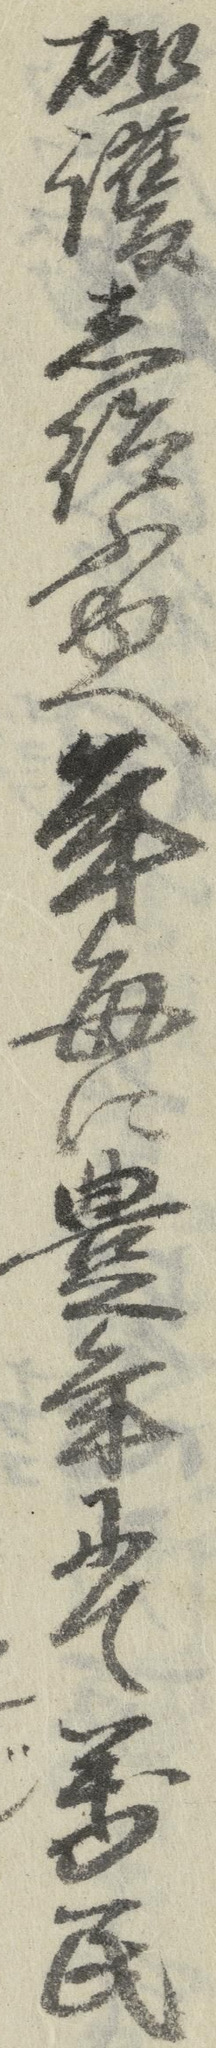加護し給ふゆへ年毎に豊年にて万民
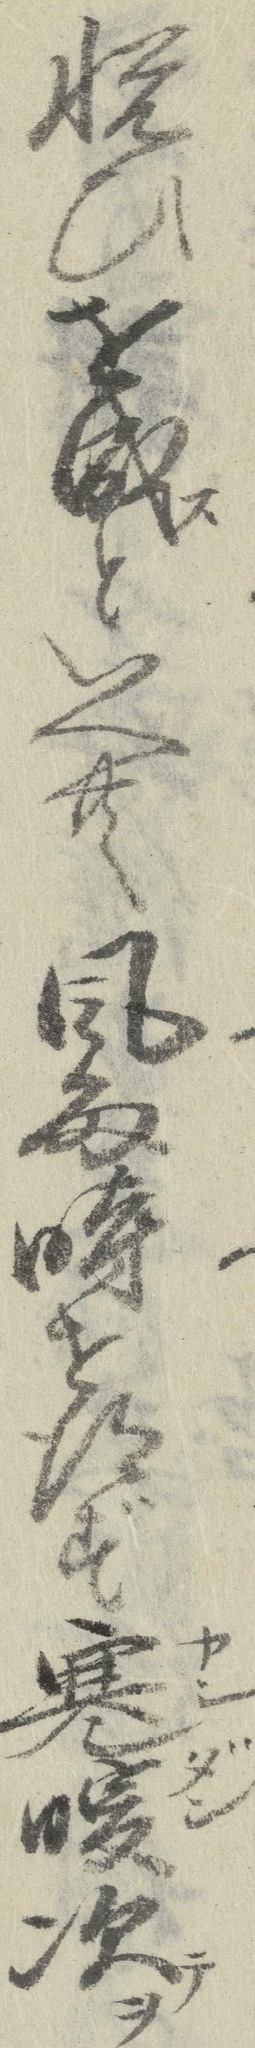悦ひを成共風雨時を得ず寒暖次
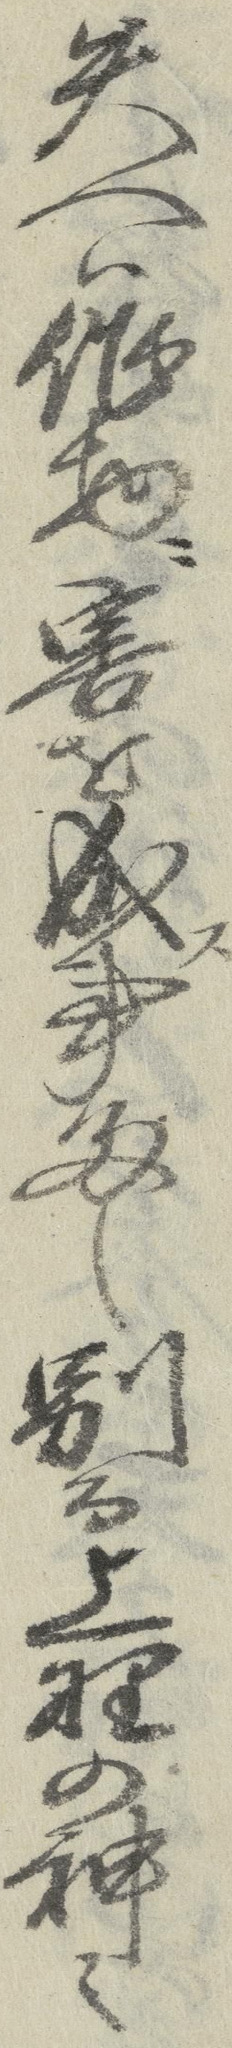失へは作物に害を成事多し別而上野の神々
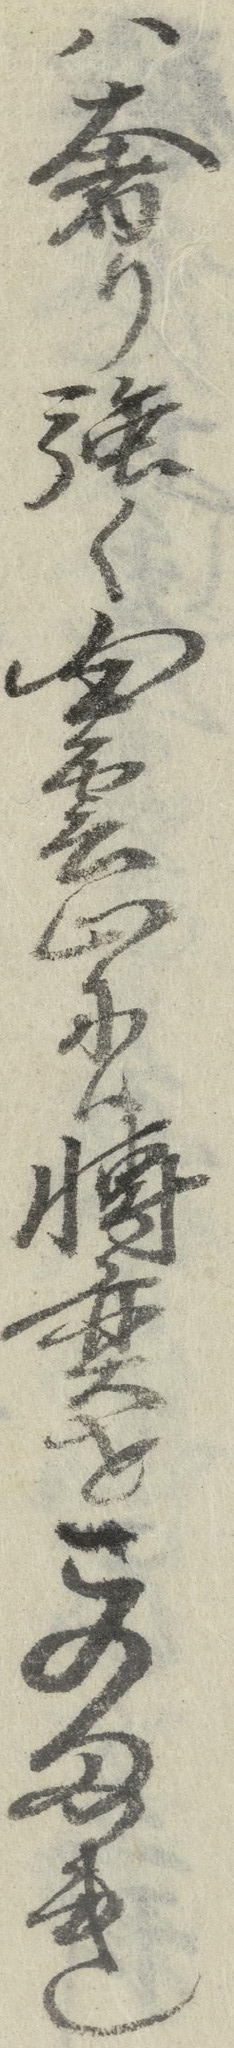は奢り強く白雲山には博奕をこのまれ
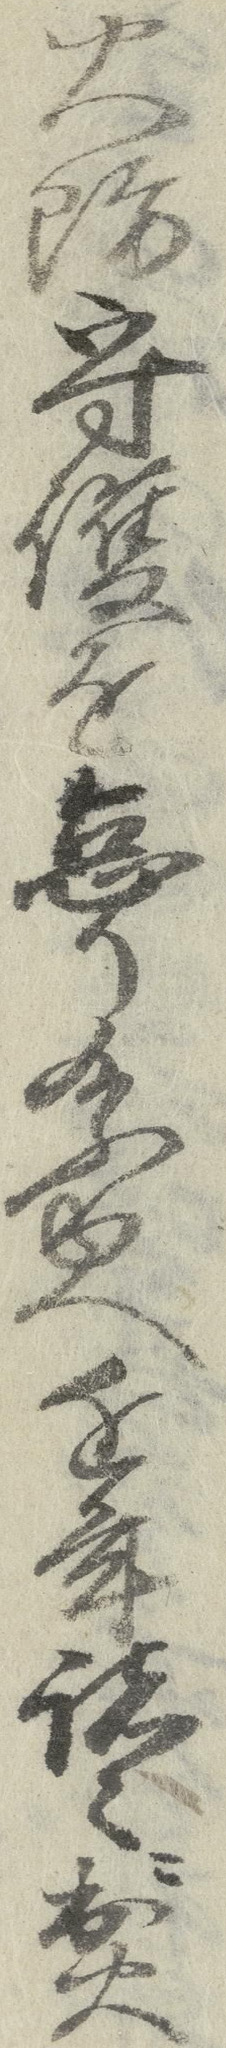火防守護を怠り給ふゆへ近年諸々に出火
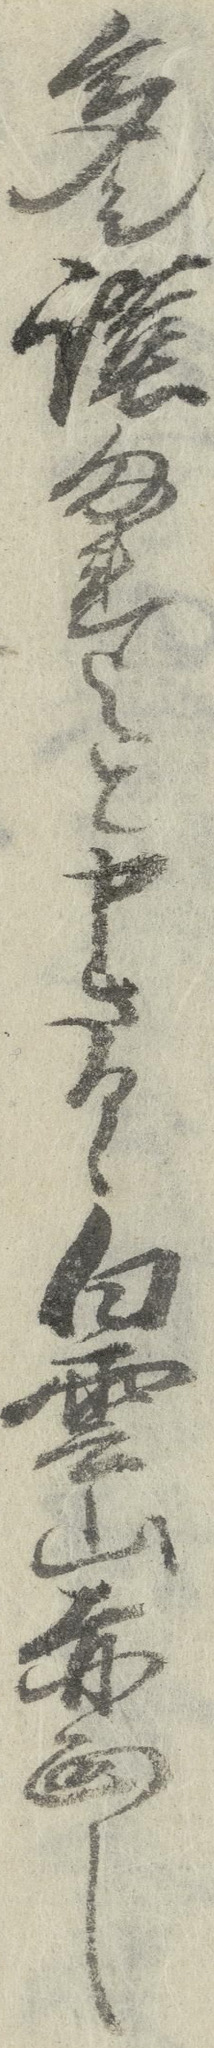多シ護たれよと申さるゝ白雲山赤面し
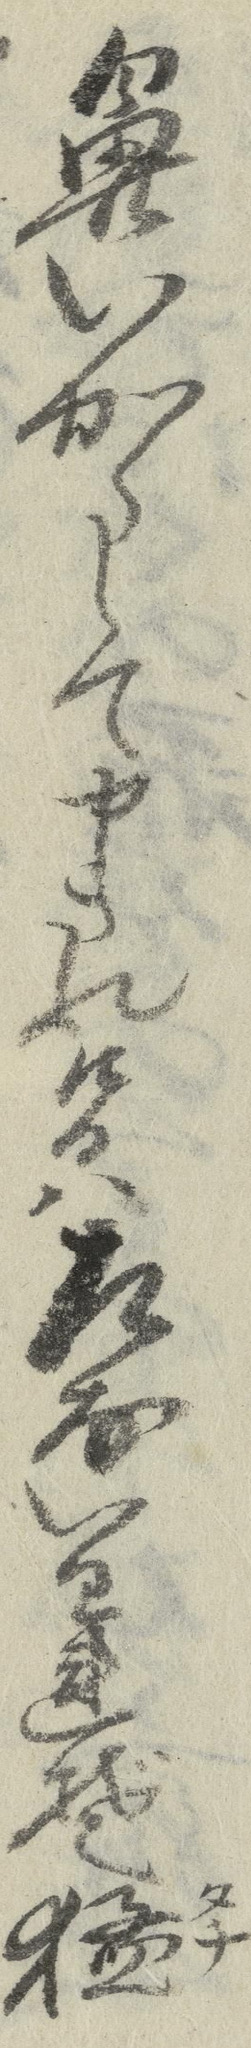鼻いかゝして申され候而は左ないわれぞ猛
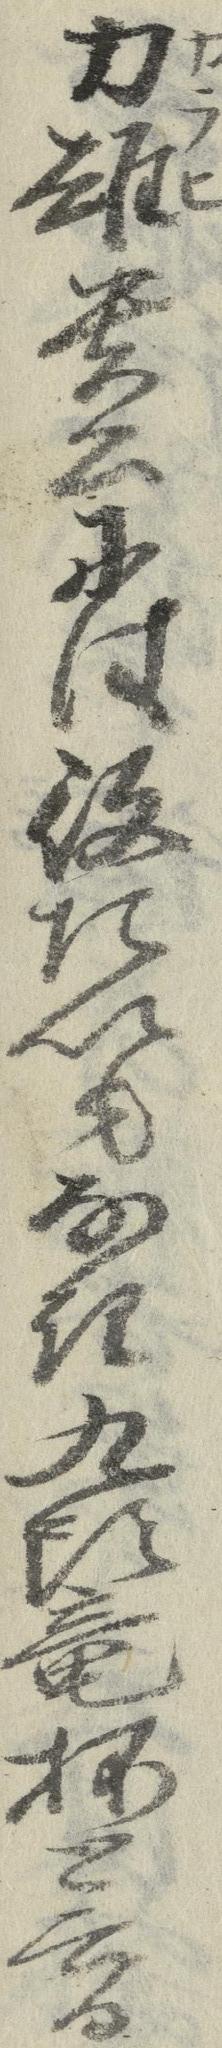力雄貴公には役たいもなき九頭竜様と云而
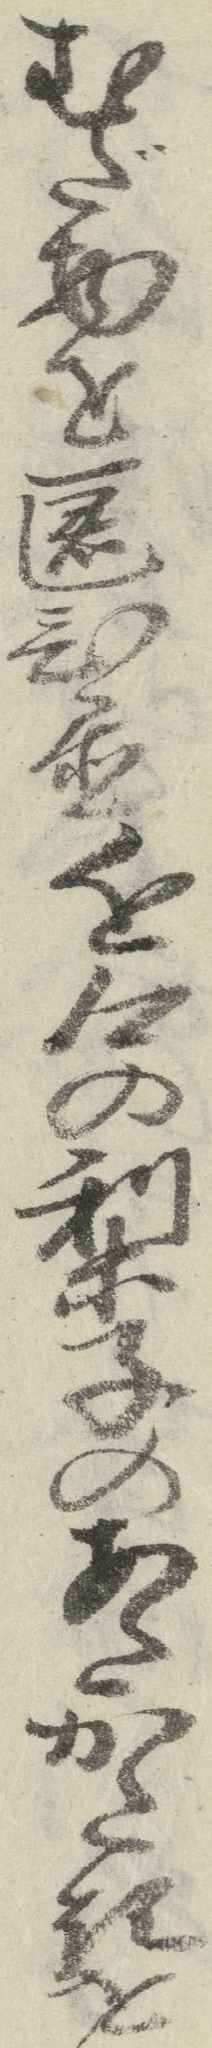むだ物を匿ひ置近郷の梨子のあたかたきを
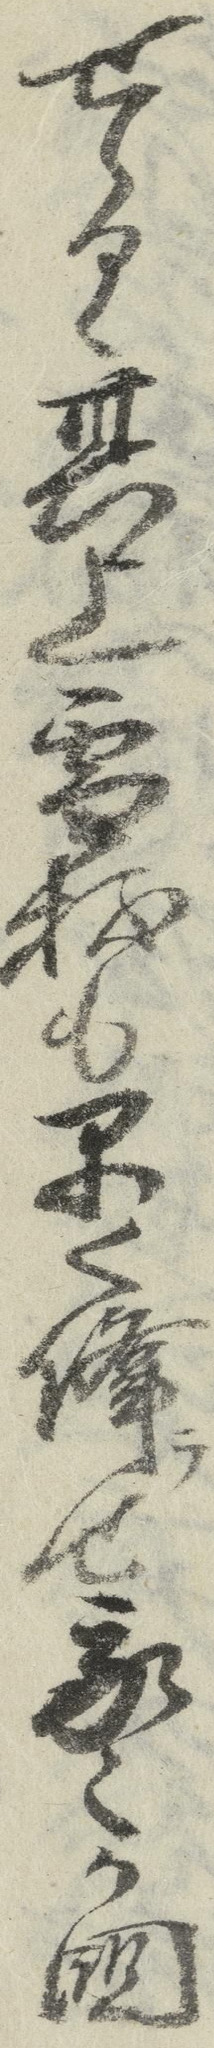せらるゝ其上雪抔も早く降我々か国
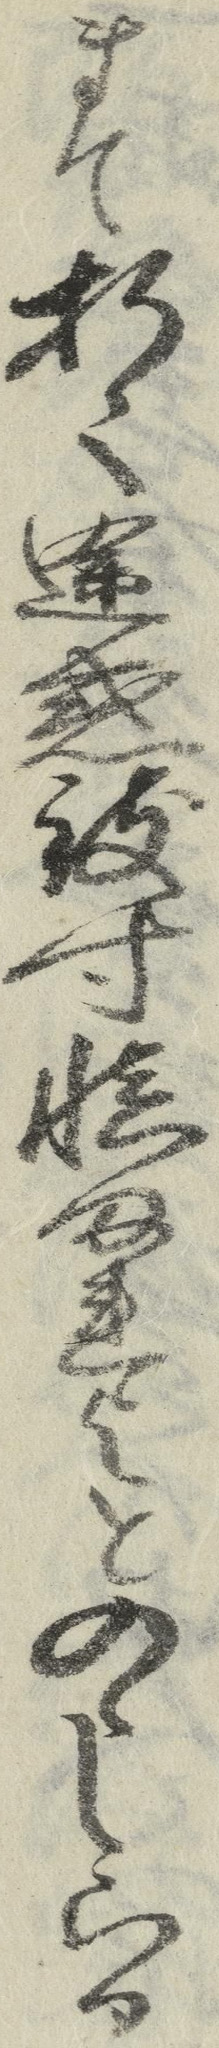まて折々迷惑致す慎たれよとのヽしらる
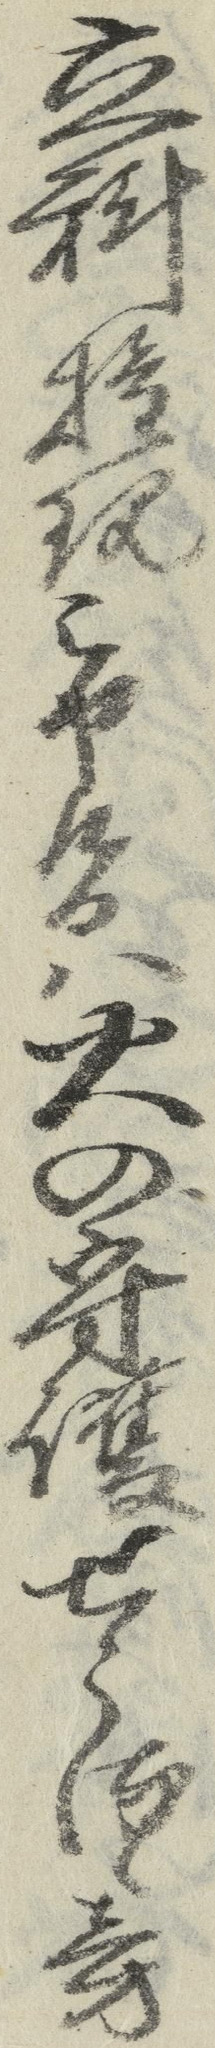立科権現と申けるは火の守護せらまゝ旁
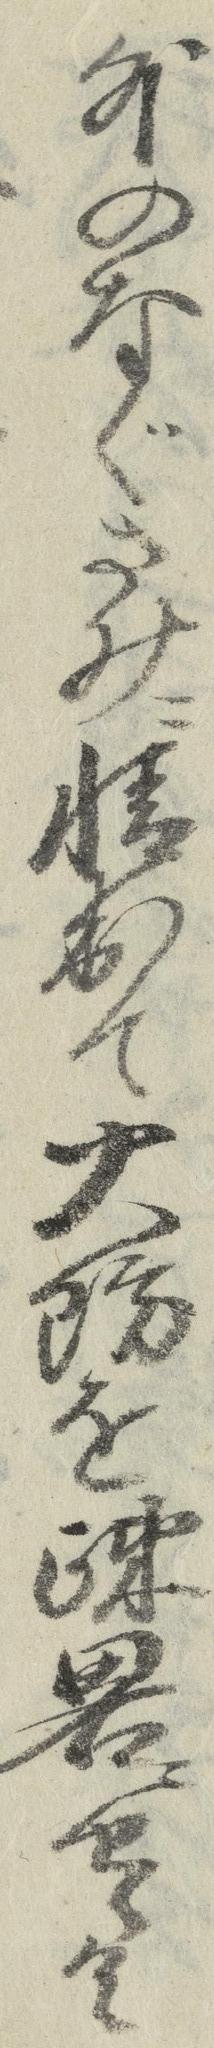外のなぐさみに情出て火防を疎略にせらるゝ
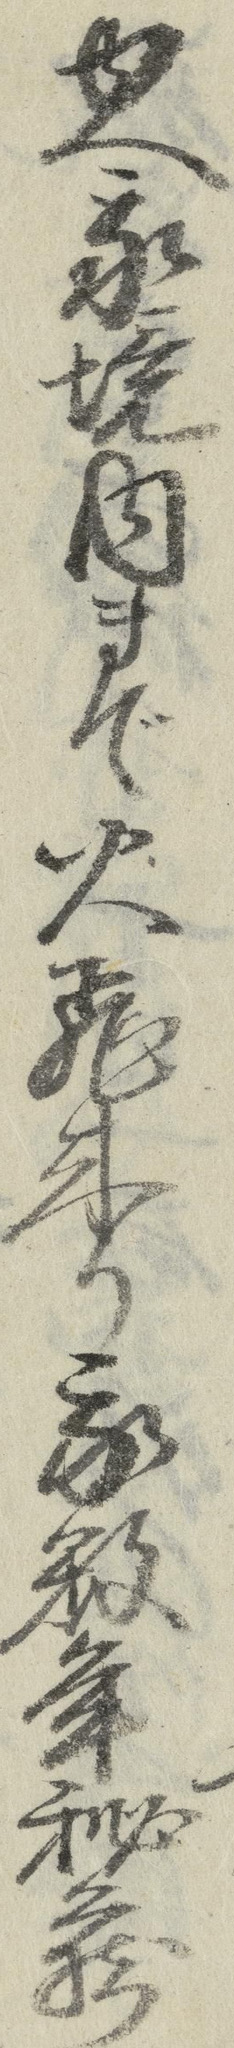ゆへ我境内まで火飛来り我数年秘蔵
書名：浅間大焼騒動記　上
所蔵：東京大学地震研究所図書室 Earthquake Research Institute Library, The University of Tokyo, JAPAN
